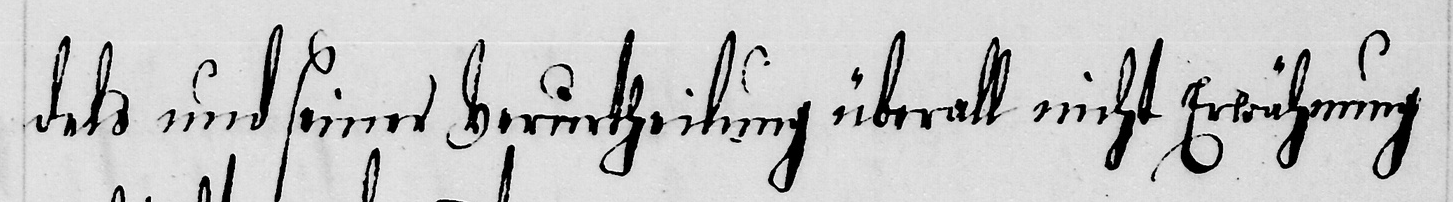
dels und seiner Verurtheilung überall nicht Erwähnung
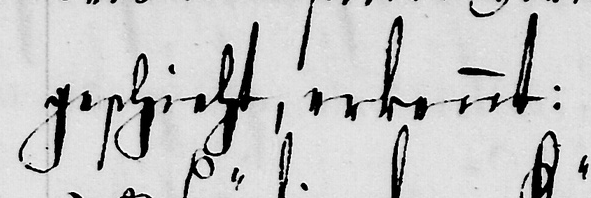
geschieht, erkennt:
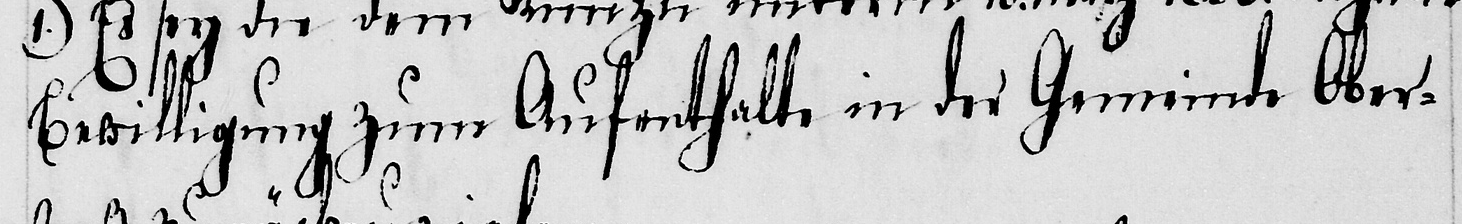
Bewilligung zum Aufenthalte in der Gemeinde Ober¬
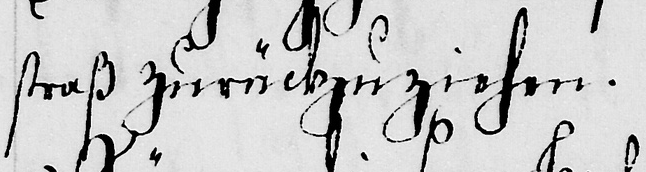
straß zurückzuziehen.
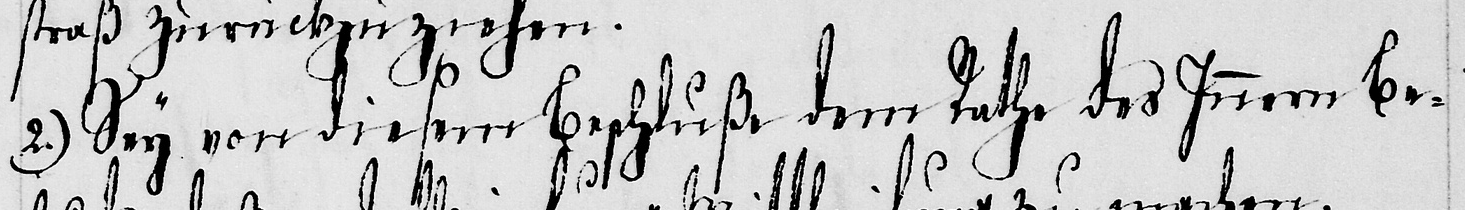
2.) Sey von diesem Beschluße dem Rathe des Innern Be¬
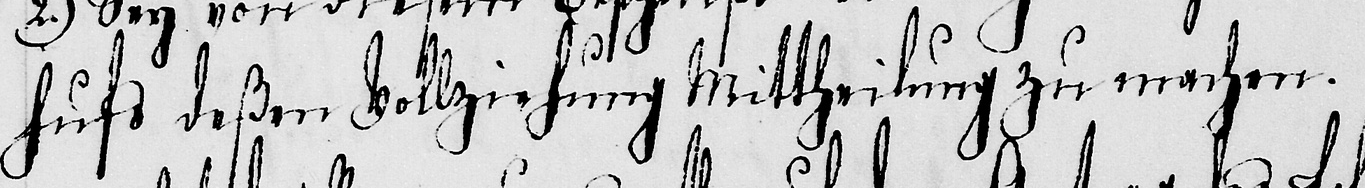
hufs deßen Vollziehung Mittheilung zu machen.
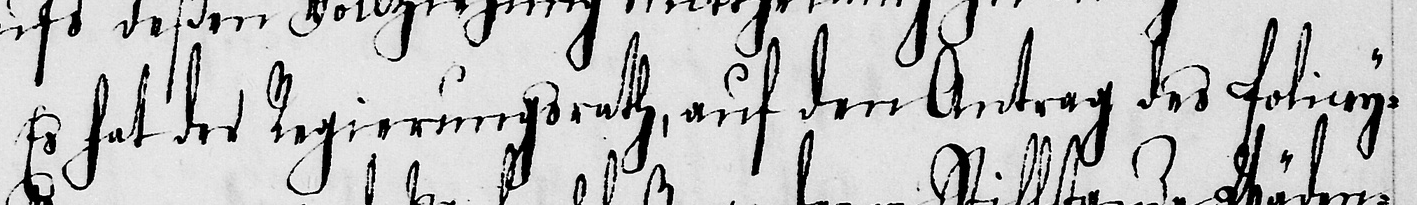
Es hat der Regierungsrath, auf den Antrag des Policey¬
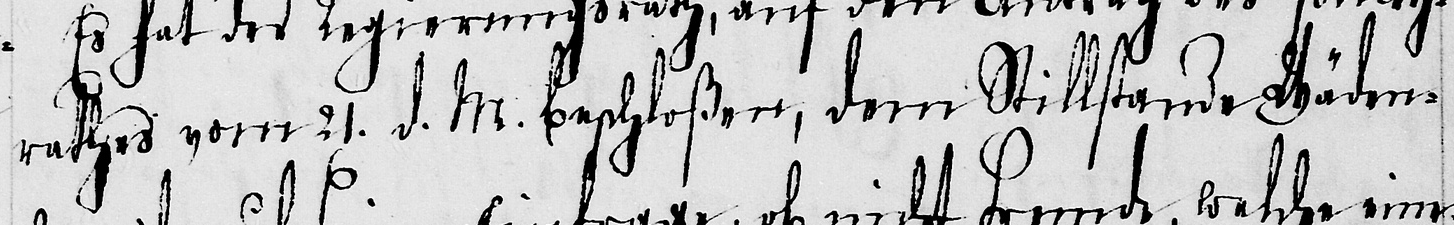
rathes vom 21. d. M. beschloßen, dem Stillstande Wädens¬
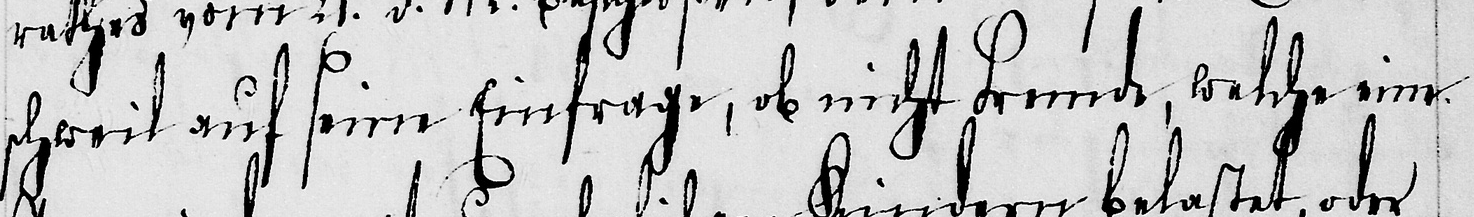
chweil auf seine Einfrage, ob nicht Fremde, welche eine
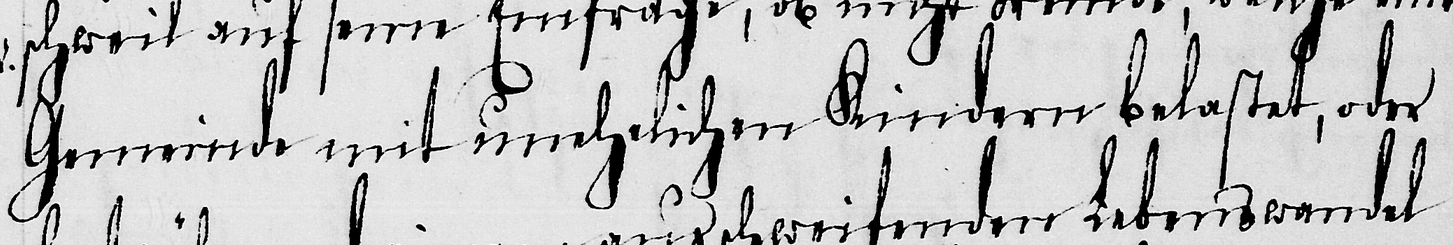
Gemeinde mit unehelichen Kindern belaste, oder
